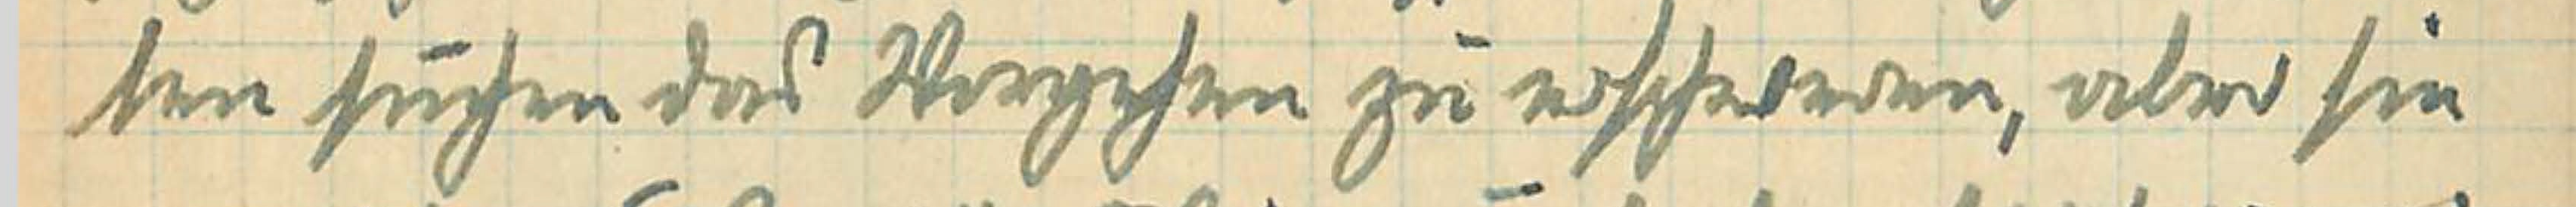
ten suchen das Vorgehen zu erschweren, aber sie
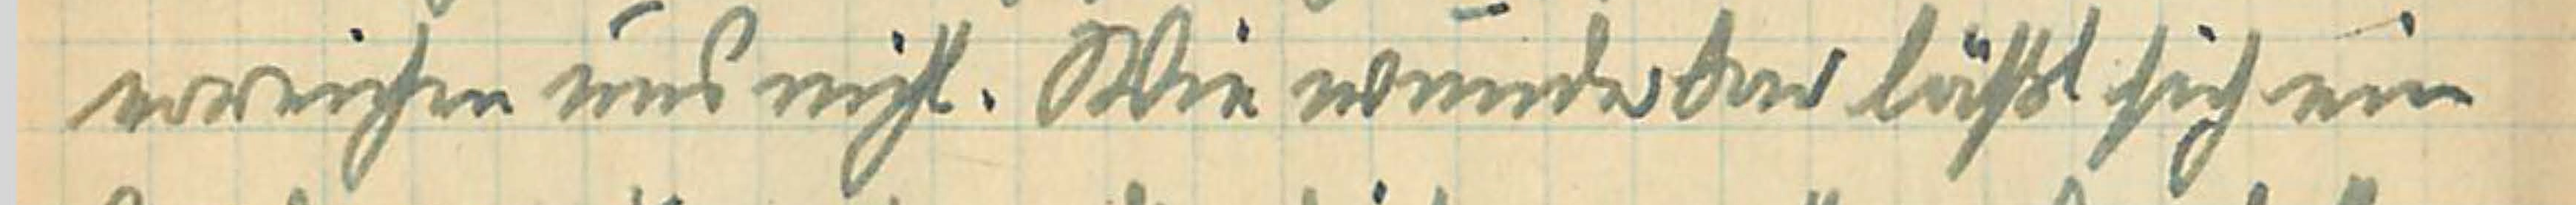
erreichen uns nicht. Wie wunderbar läßt sich ein
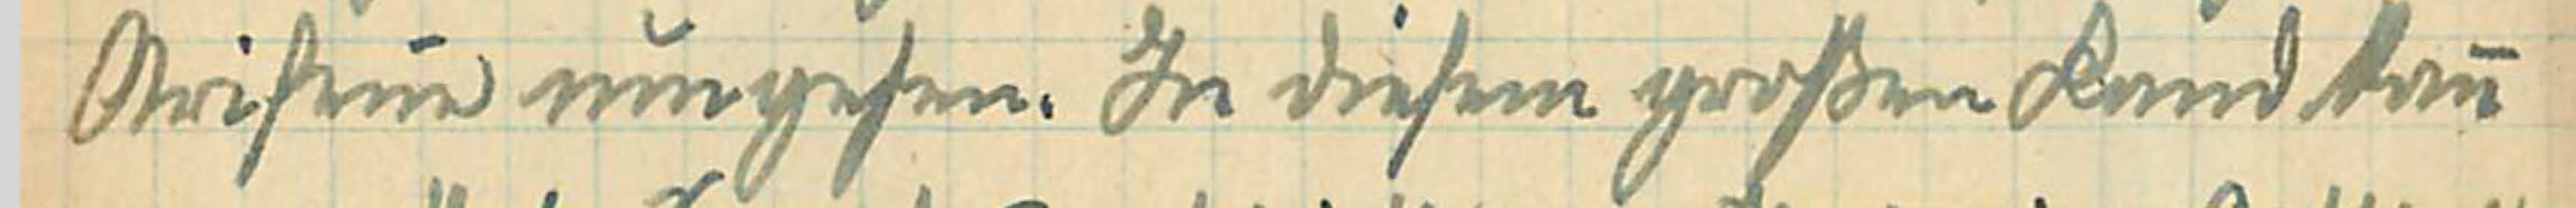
Arifeuer umgehen. In diesem großen Land kann
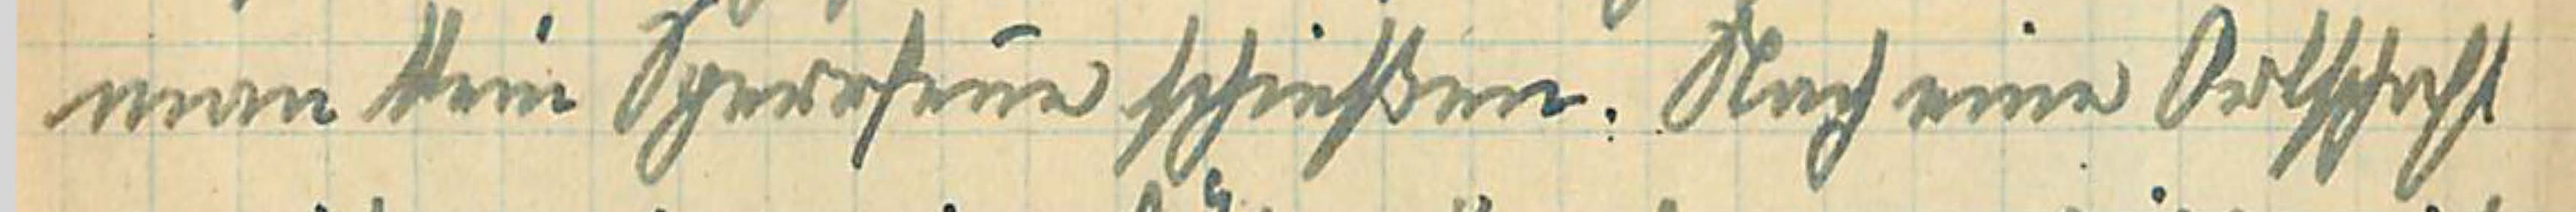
man kein Sperrfeuer schießen. Nach einer Ortschaft
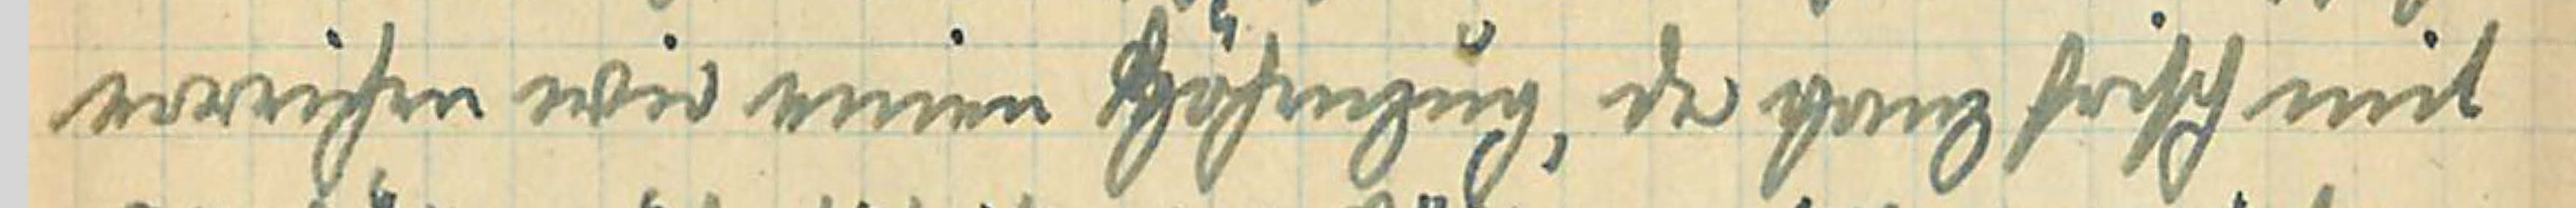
erreichen wir einen Höhenzug, der ganz frisch mit
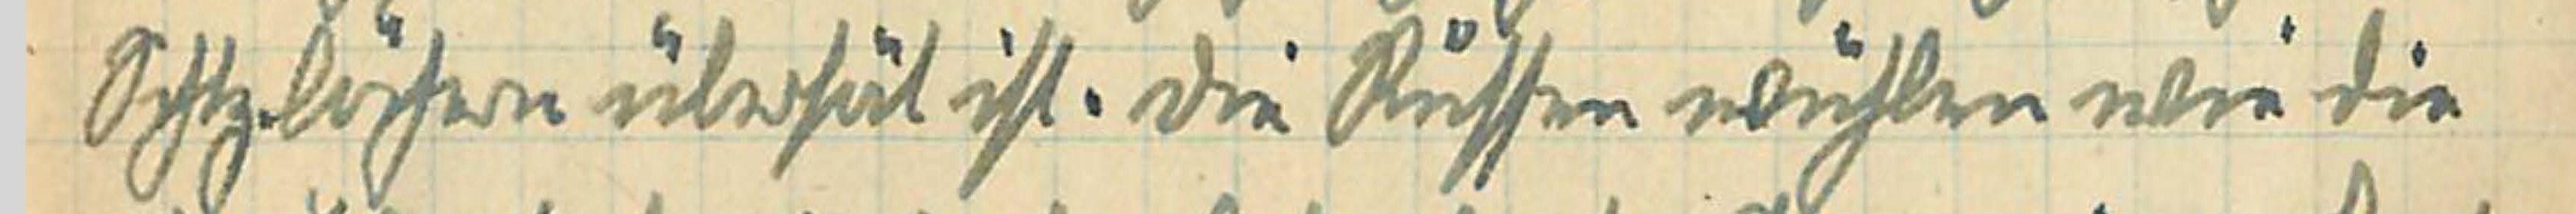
Schtznlöchern übersät ist. Die Russen wühlen wie die
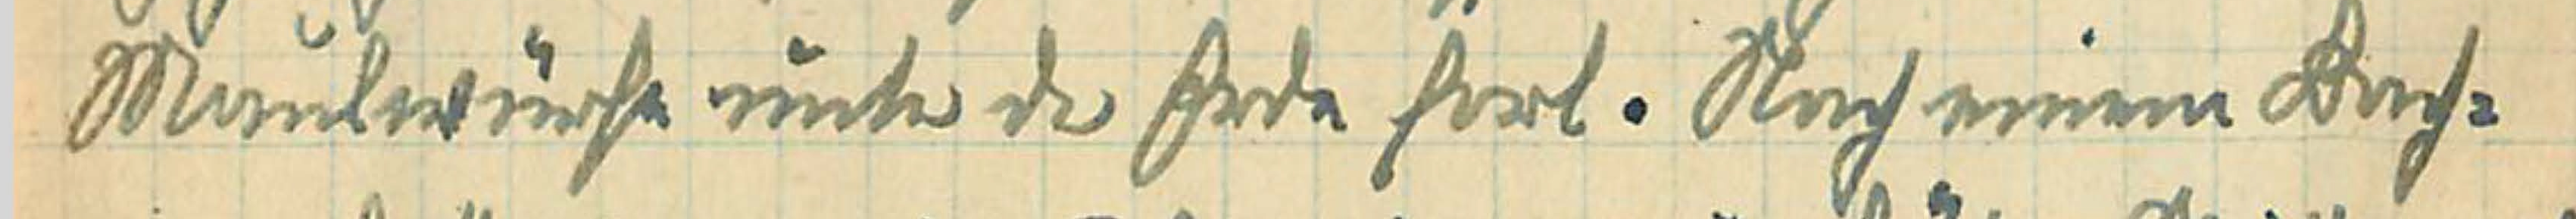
Maulwürfe unter der Erde fort. Nach einem Bach-
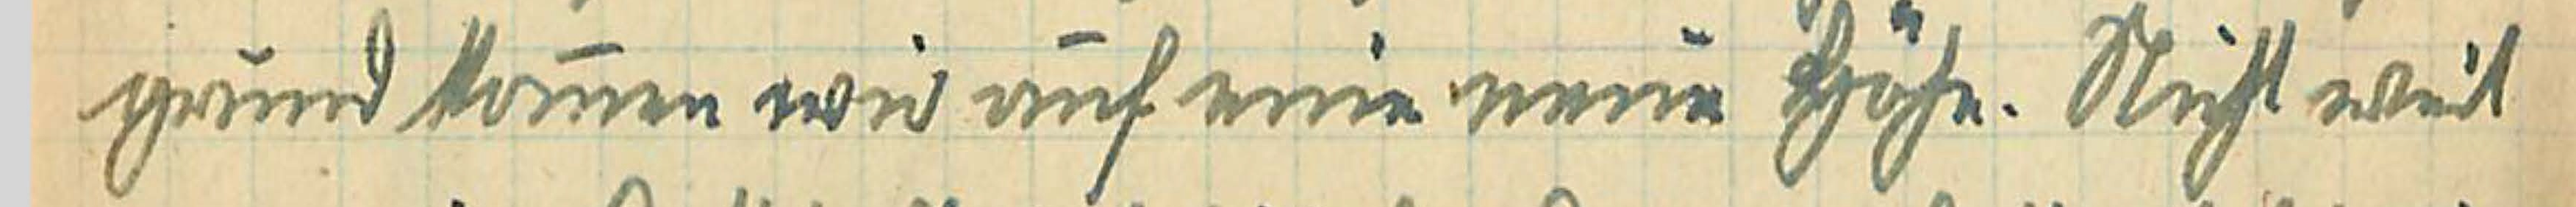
grund kommen wir auf eine neue Höhe. Nicht weit
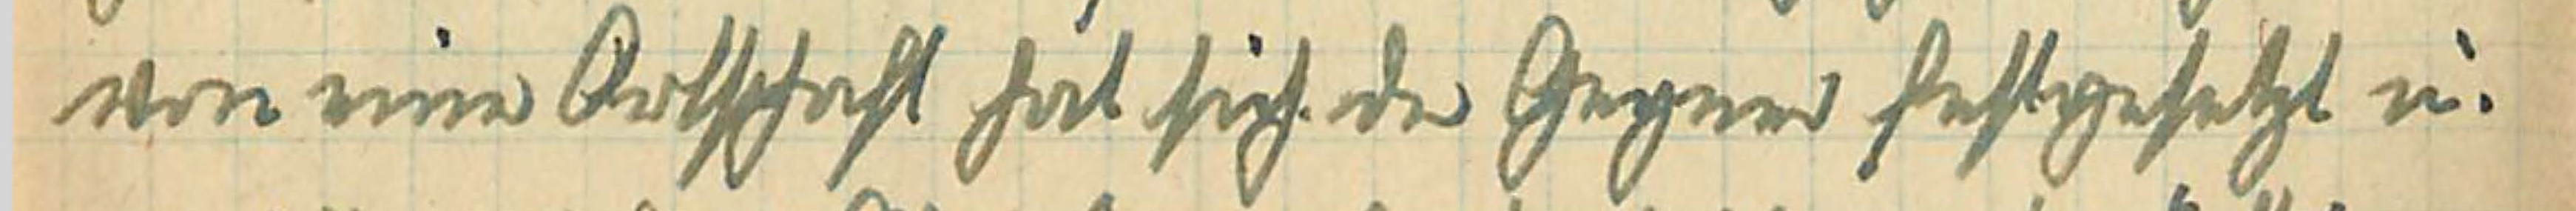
von einer Ortschaft hat sich der Gegner festgesetzt u.
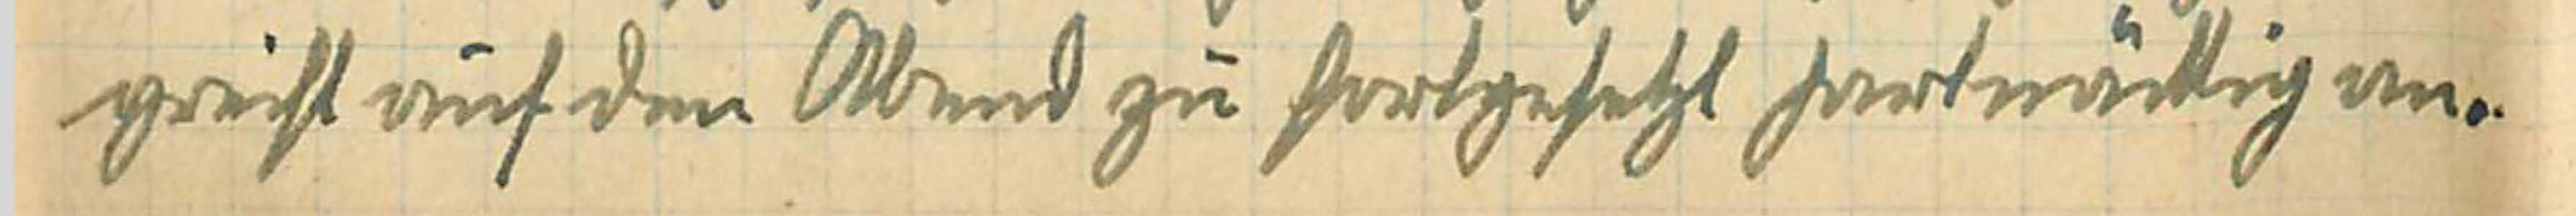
greift auf den Abend zu fortgesetzt hartnäckig an.
